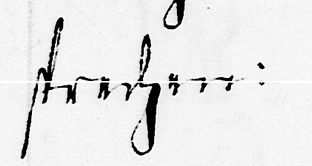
sprechen:
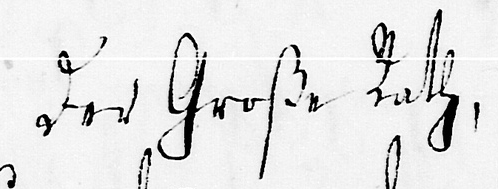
Der Große Rath,
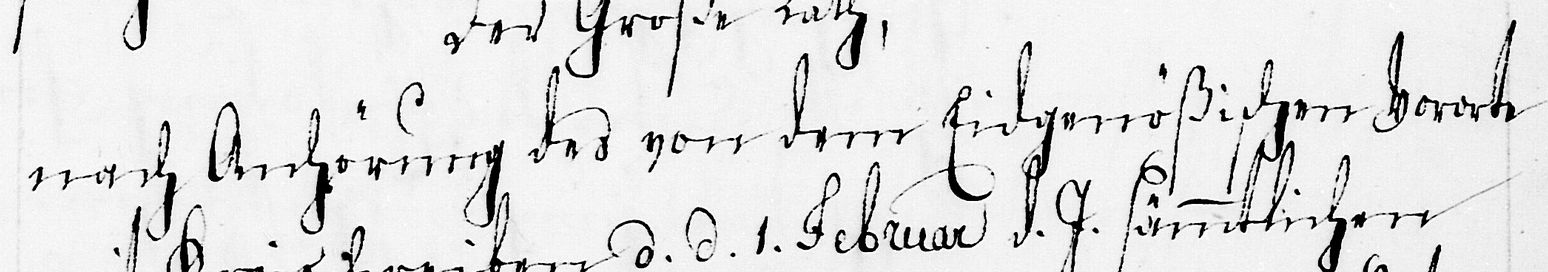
nach Anhörung des von dem Eidgenößischen Vororte
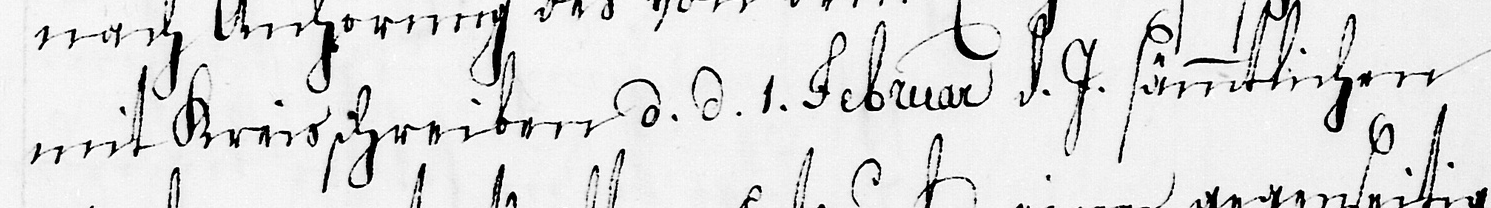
mit Kreisschreiben d. d. 1. Februar d. J. sämmtlichen
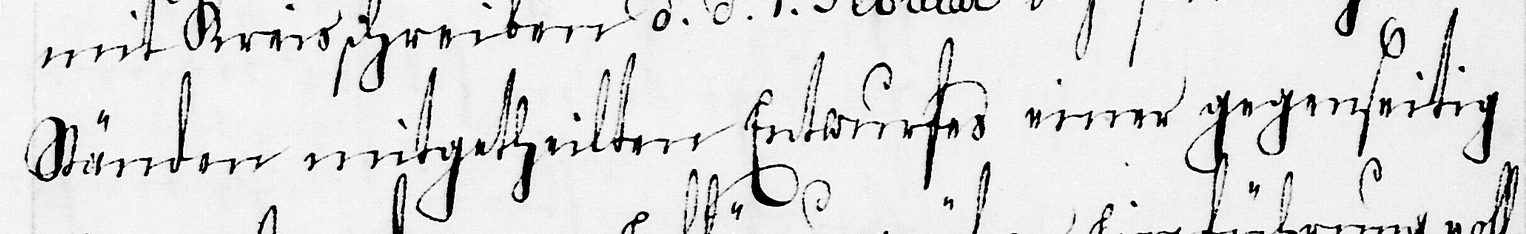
Ständen mitgetheilten Entwurfes einer gegenseitig
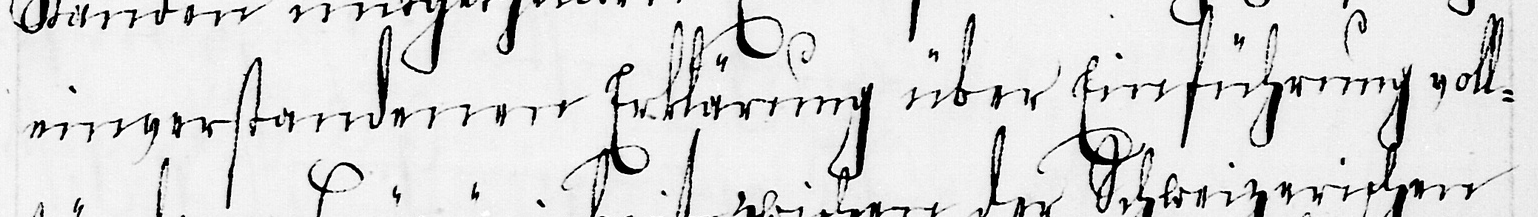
einverstandenen Erklärung über Einführung voll¬
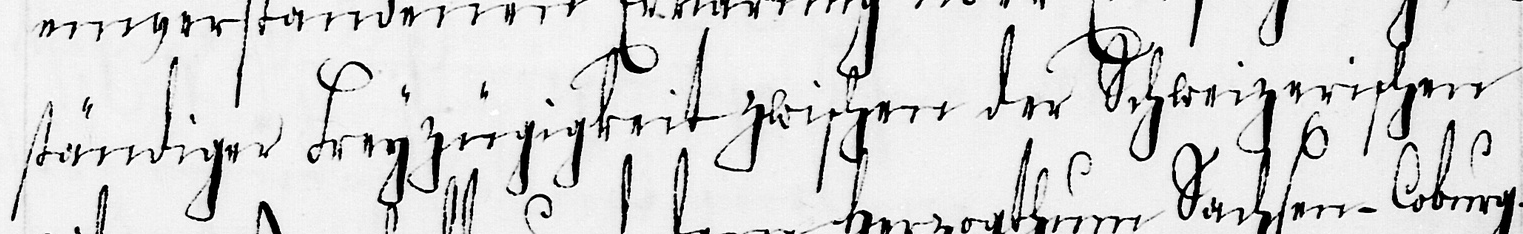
ständiger Freyzügigkeit zwischen der Schweizerischen
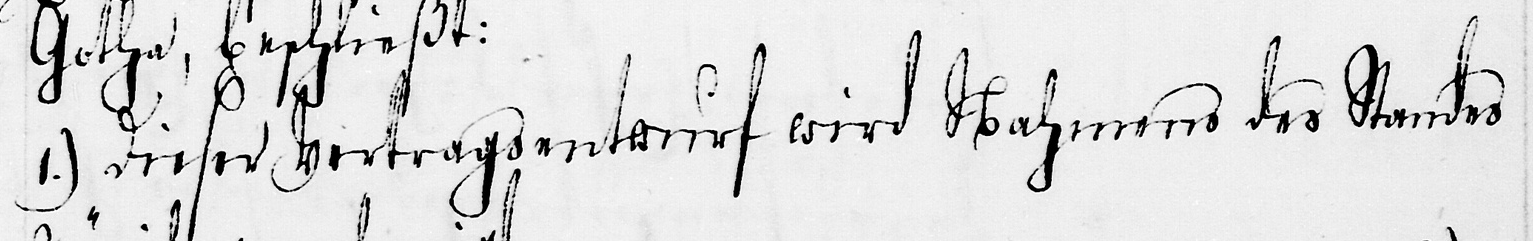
1.) Dieser Vertragsentwurf wird Nahmens des Standes
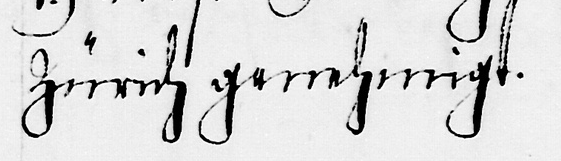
Zürich genehmigt.
